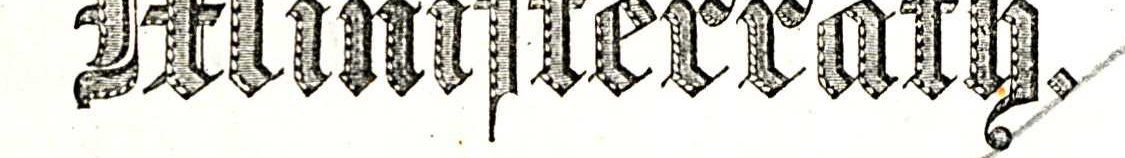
Ministerrath.
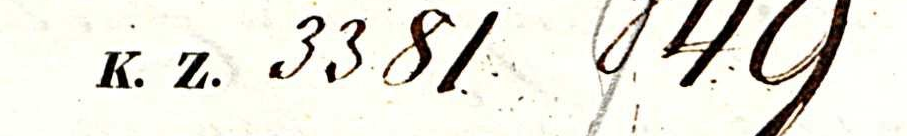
K. Z. 3381 849
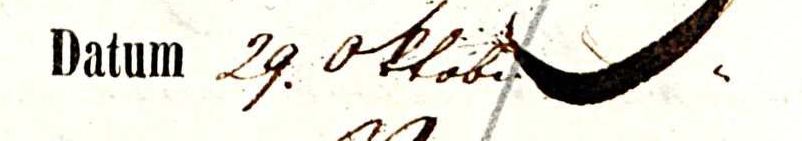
Datum 29. Oktober 849
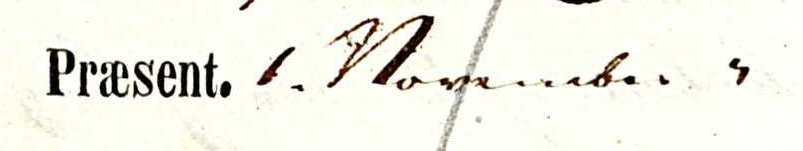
Præsent. 1. November 849
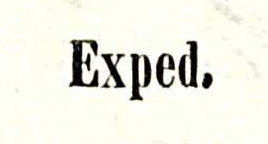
Exped.
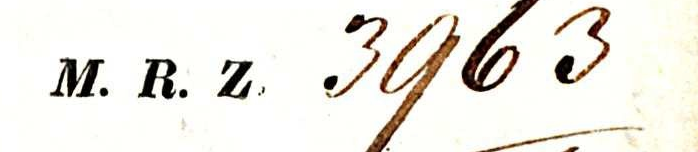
M. R. Z.3969
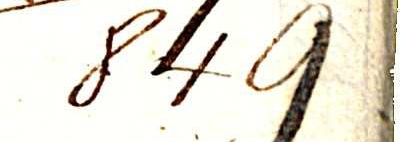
849
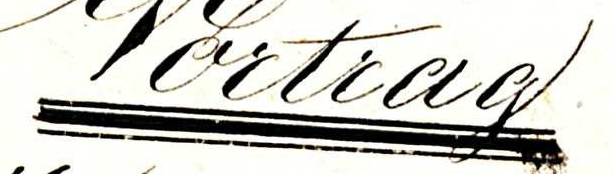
Vortrag
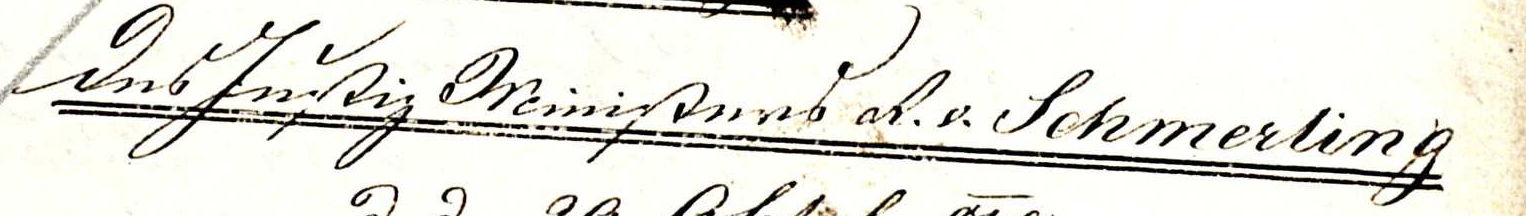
des Justiz Ministers R. v. Schmerling
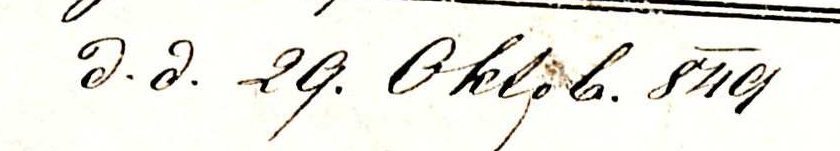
d. d. 29. Oktob. 849
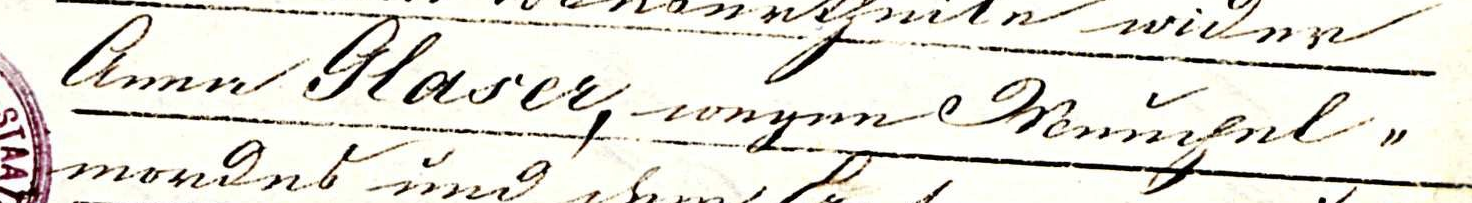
Anna Glaser, wegen Munchel¬
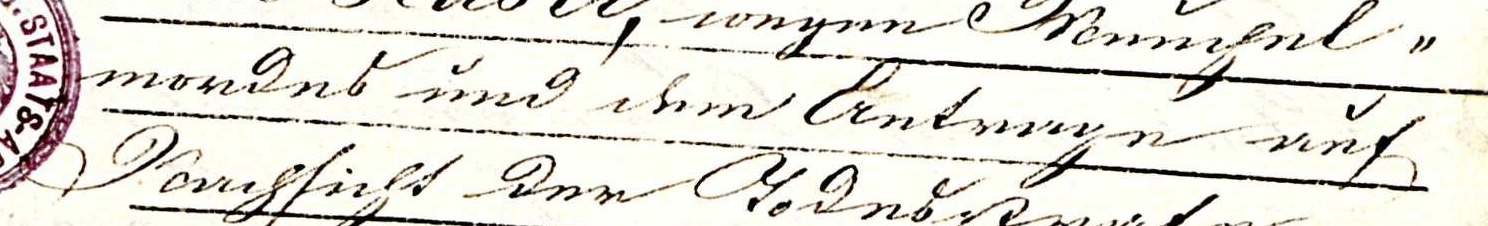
mordes und dem Antrage auf
